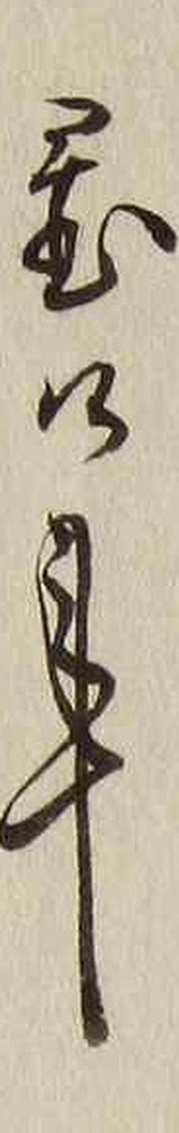置候事
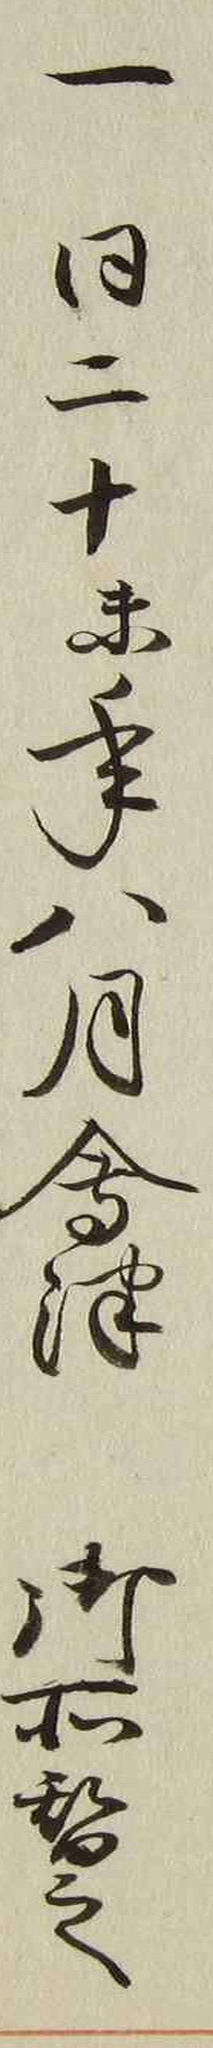一同二十未年八月会津御所替之
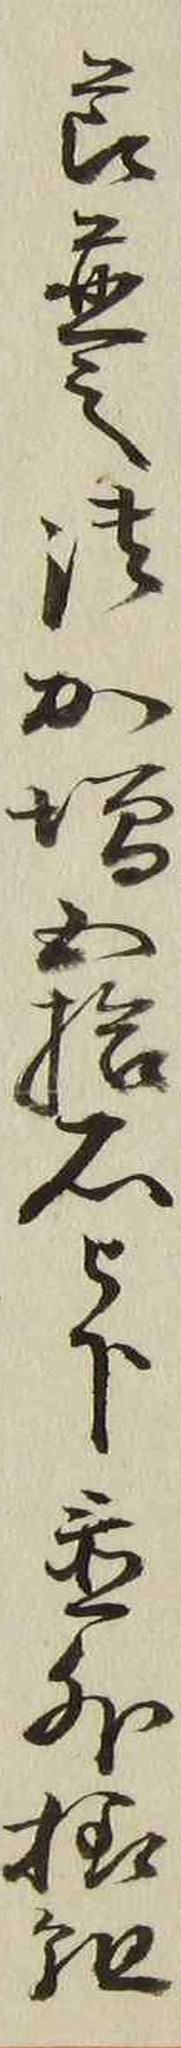節並之御加増五拾石被下置外様組
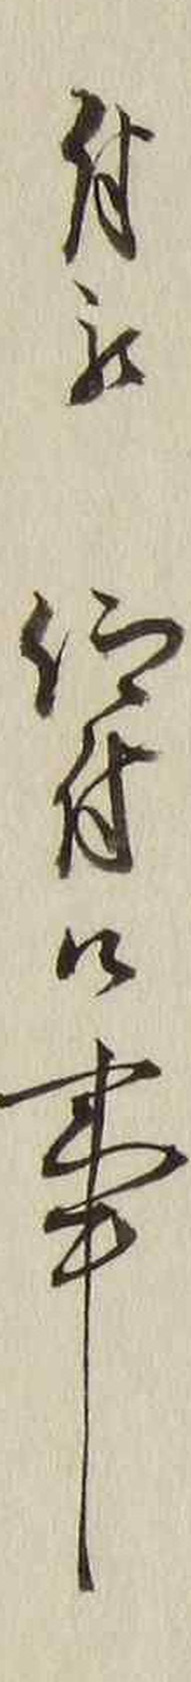付被仰付候事
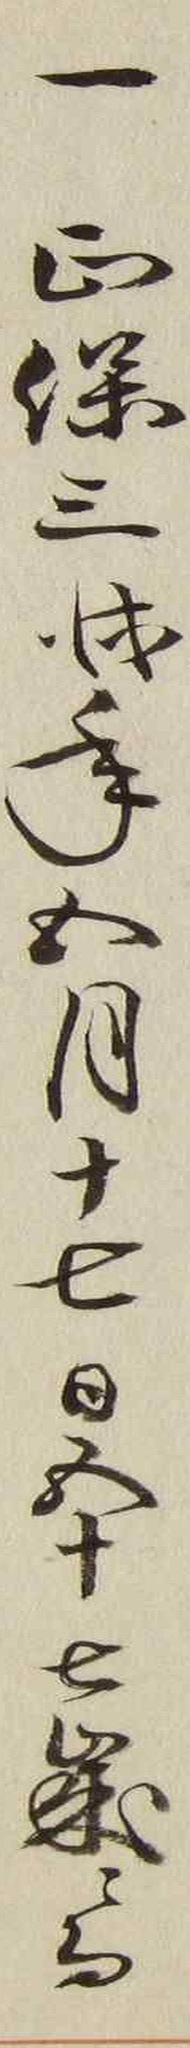一正保三戌年五月十七日五十七歳ニ而
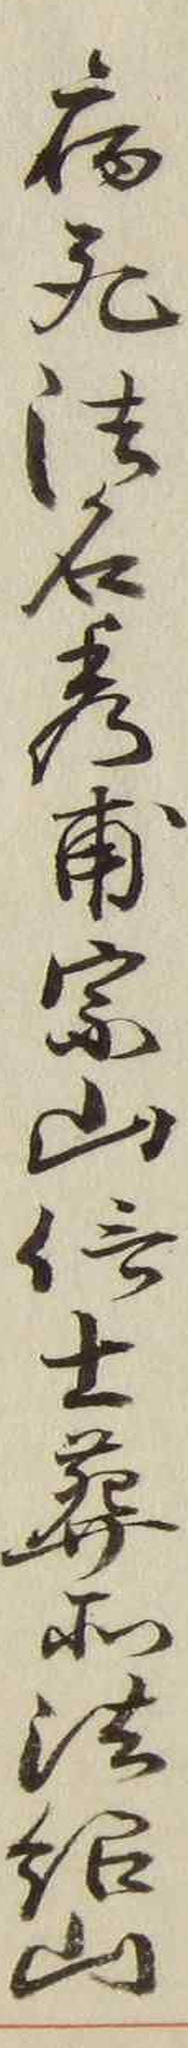病死法名秀甫宗山信士葬所法紹山

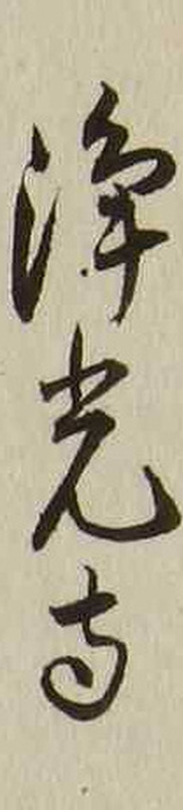浄光寺
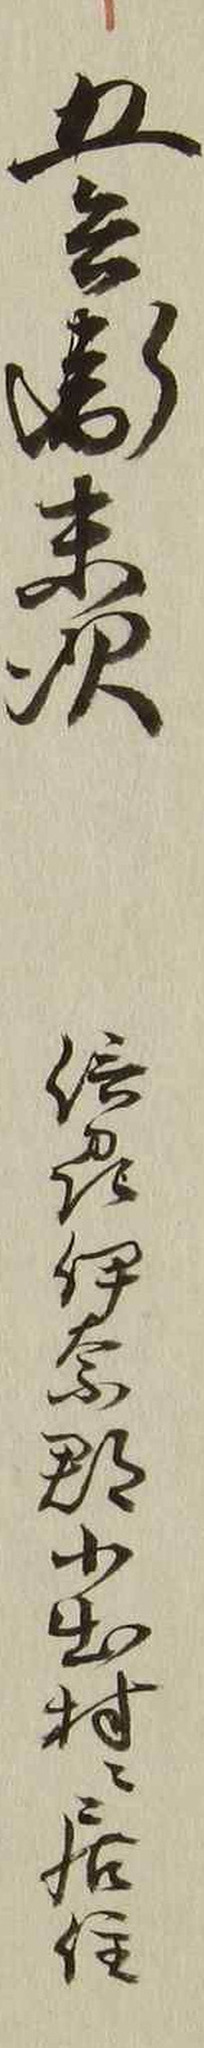五兵衛末次信濃伊奈郡小出村ニ居住
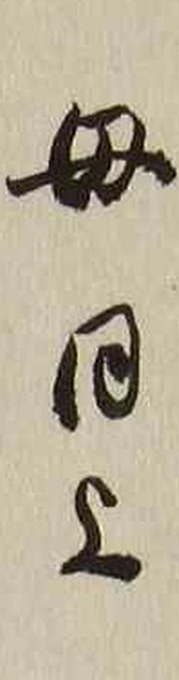母同上
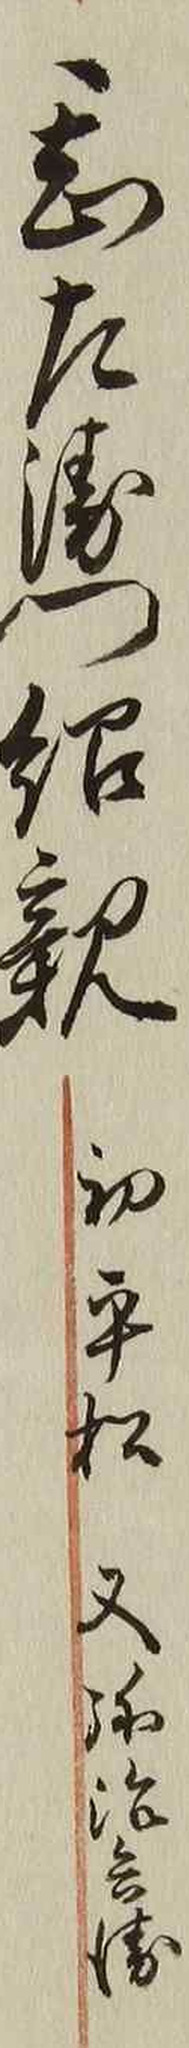甚左衛門紹親初平松又弥次兵衛
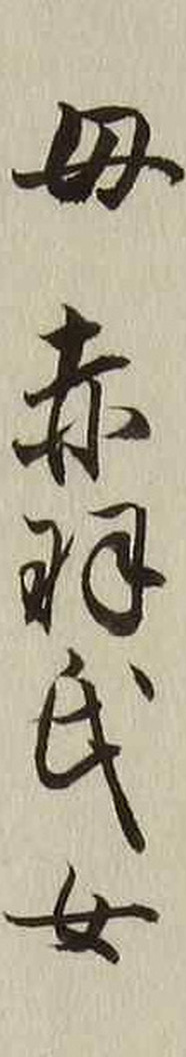母赤羽氏女
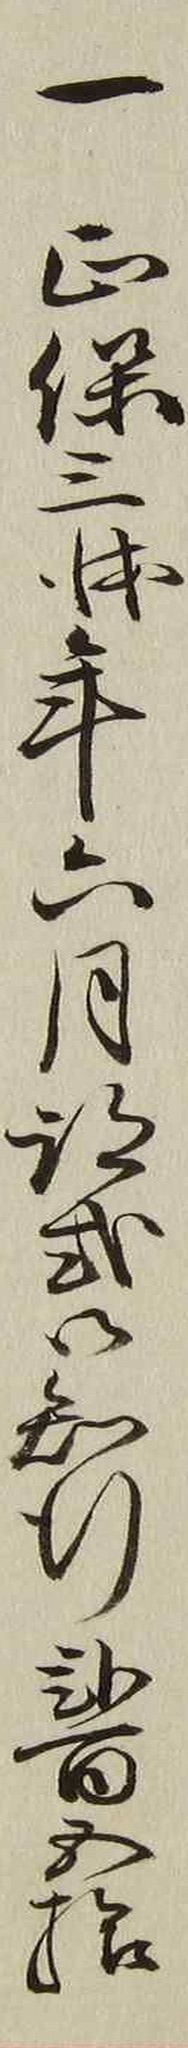一正保三戌年跡式御知行弐百五拾
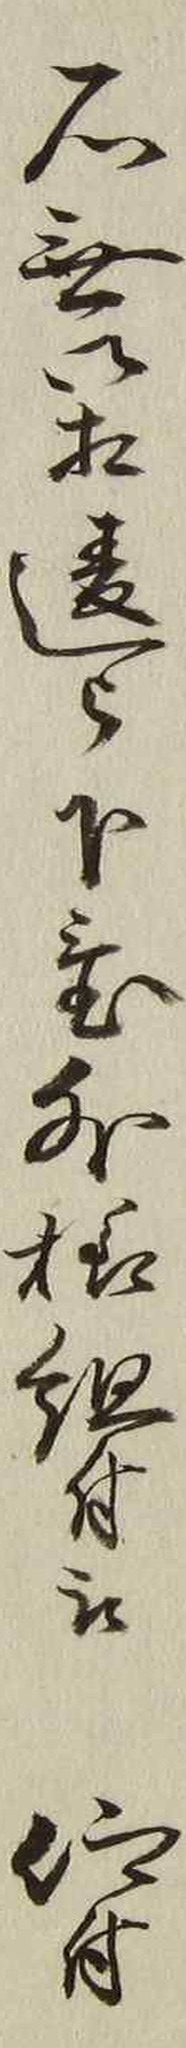石無御相違被下置外様組付被仰付
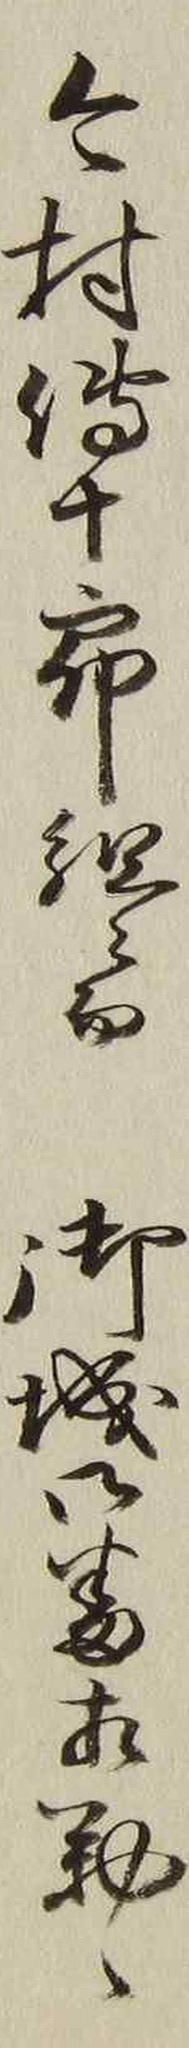今村伝十郎組ニ而御城御番相勤候
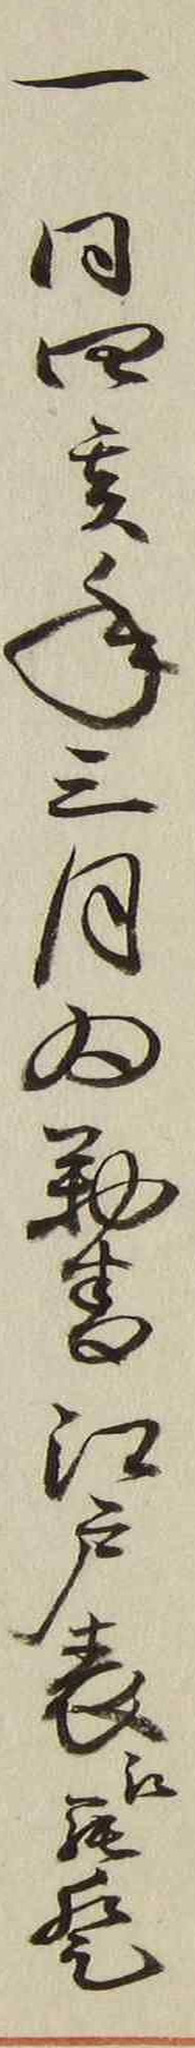一同四亥年三月為勤番江戸表江罷登
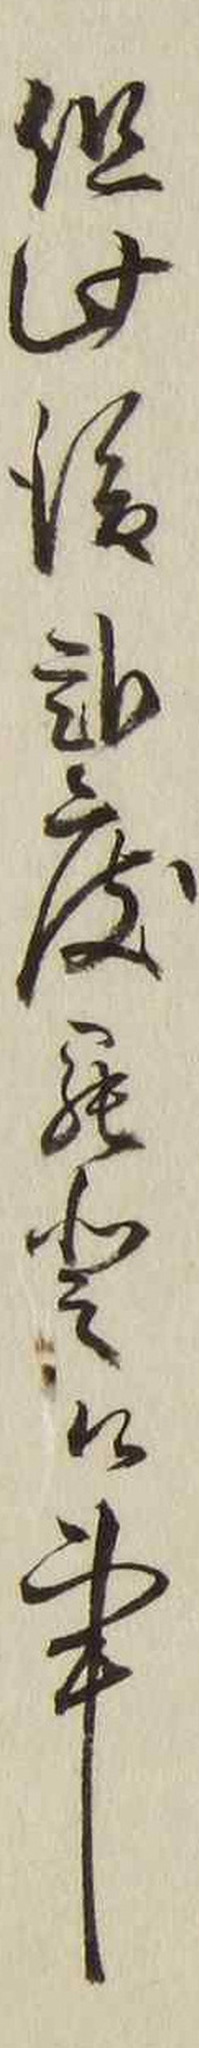但此後弐度罷登候事
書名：諸士系譜　巻之60　と之部3
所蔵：会津若松市立会津図書館
